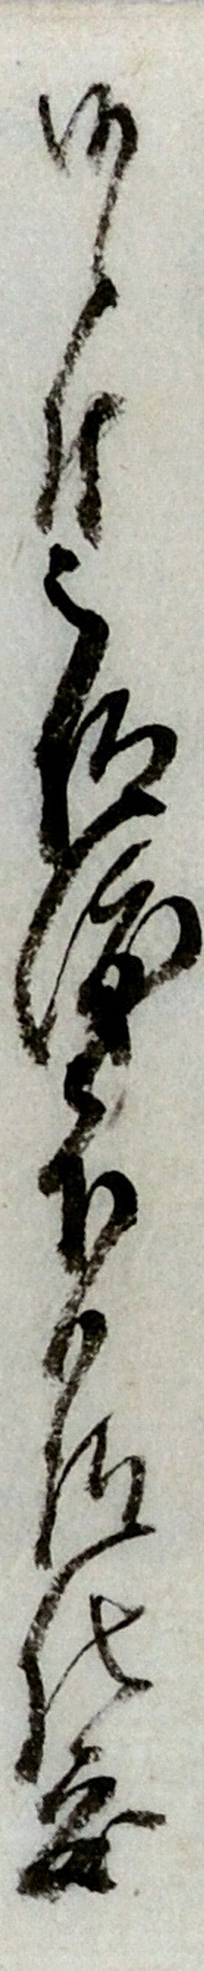候に付被仰渡被下候様仕度
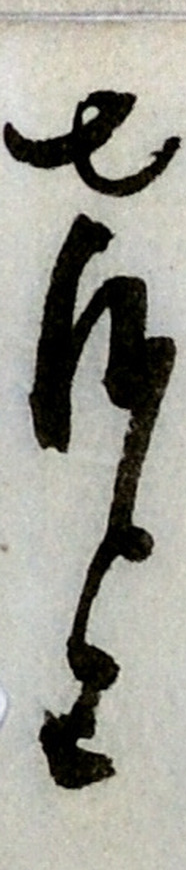奉存候以上
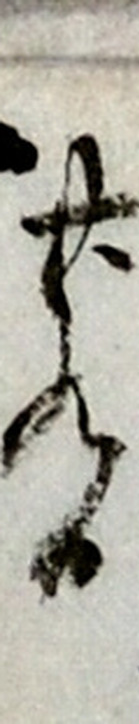廿九日
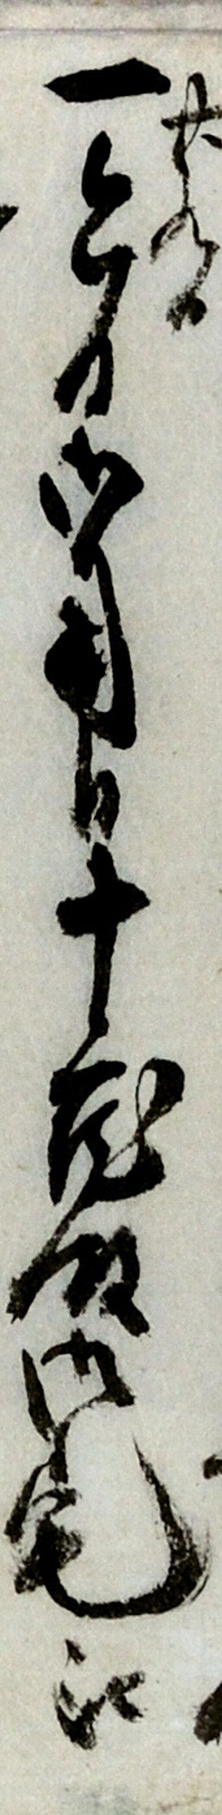一今日御用日十蔵殿御宅え
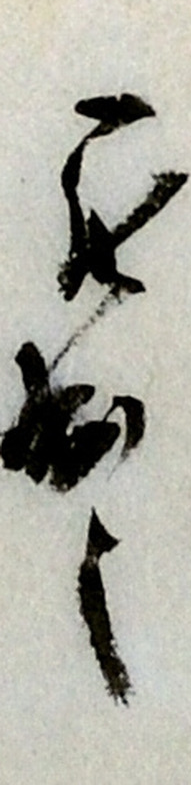罷出候
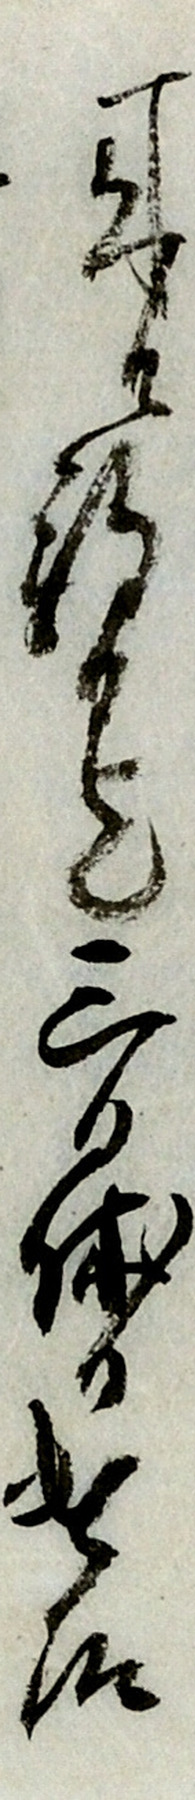来ル朔日迄三日休日遣様
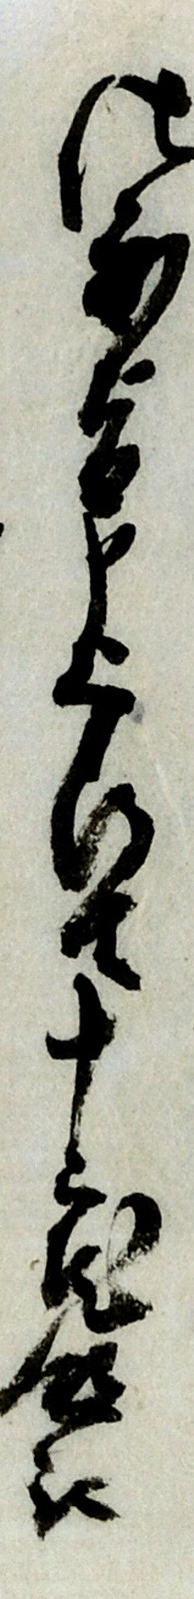仕度旨申上候得は十蔵殿被
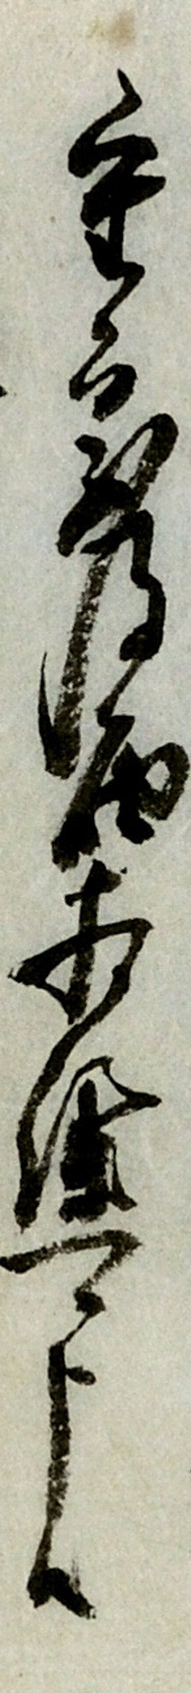重而不及届相済可申候
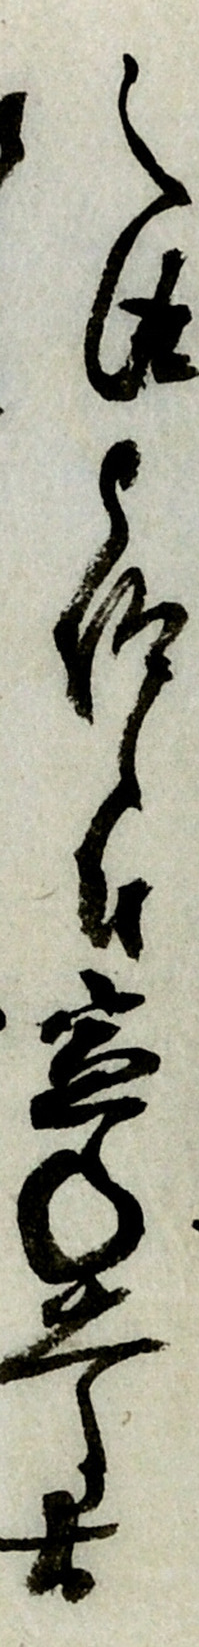之趣被仰候ニ付寅年十一月十日
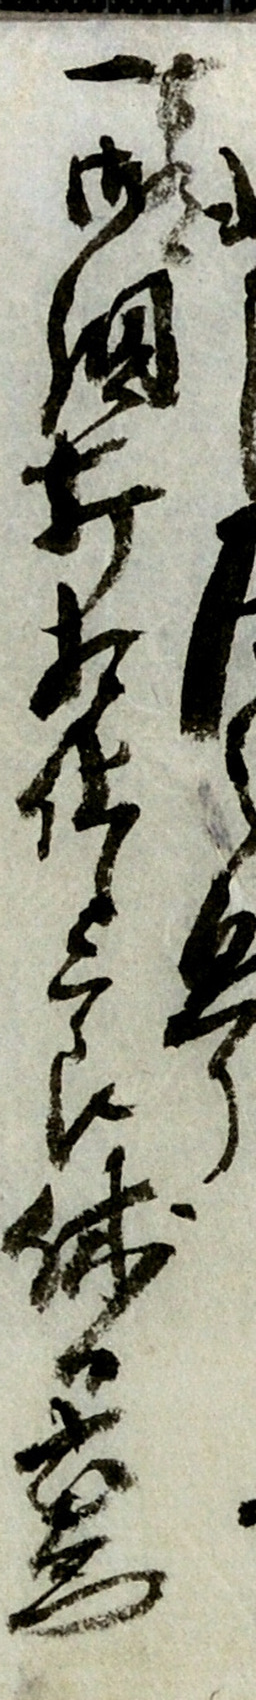一御網打相仕候節休日六右衛門
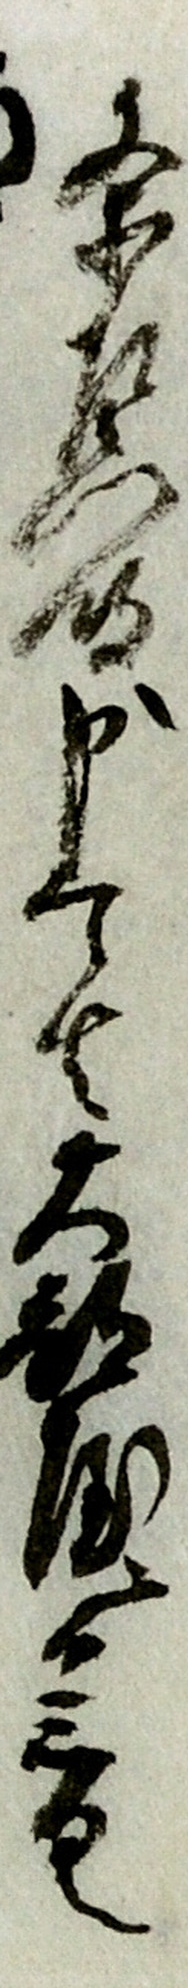条左衛門殿へ申上候は大部屋ニ而三日之
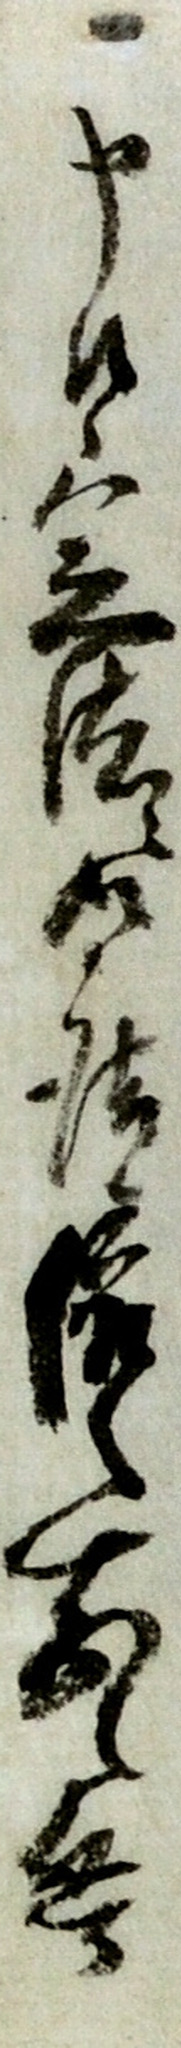申候定法ニ御座候依之前之通り

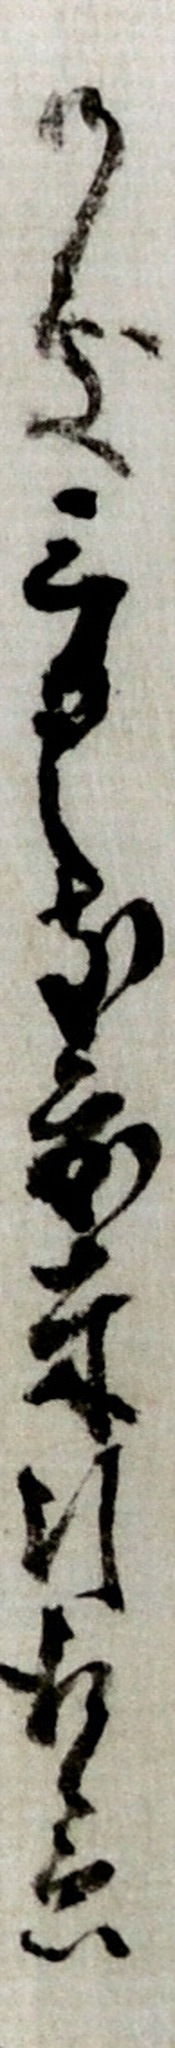候処三日之義亦米引取候而ハ
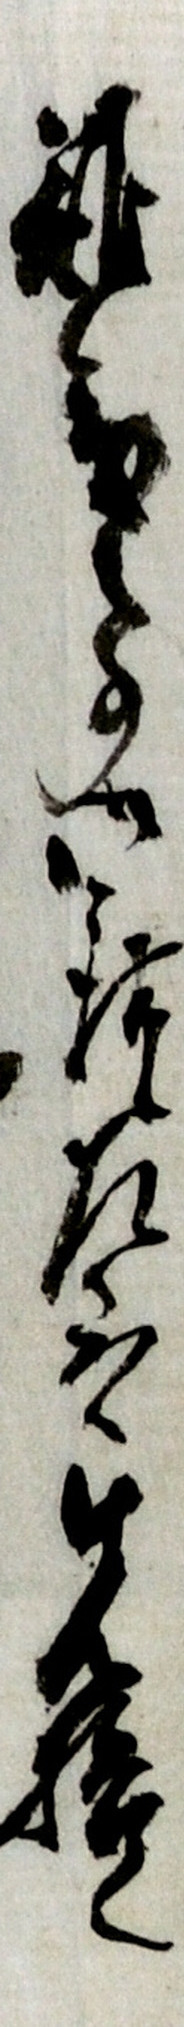難義之事御座候左候ハヽ先格之
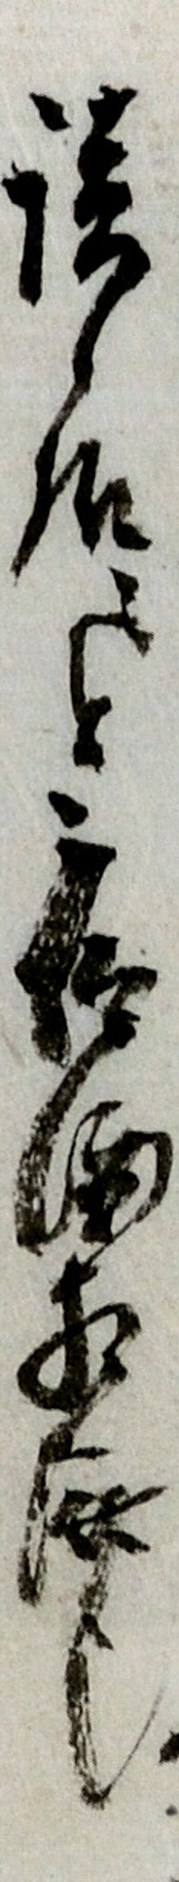談候様ニと被仰渡相済候
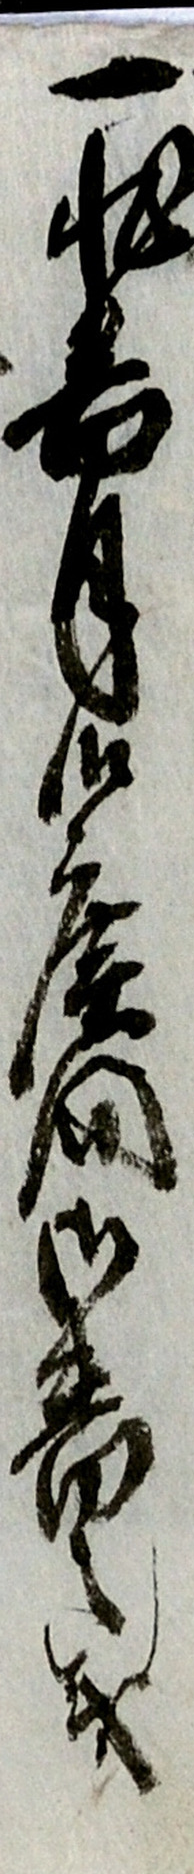一非番月御広間御番之義
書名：分一方諸事御用留帳
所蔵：伊那市立高遠町図書館・合同会社AMANE
